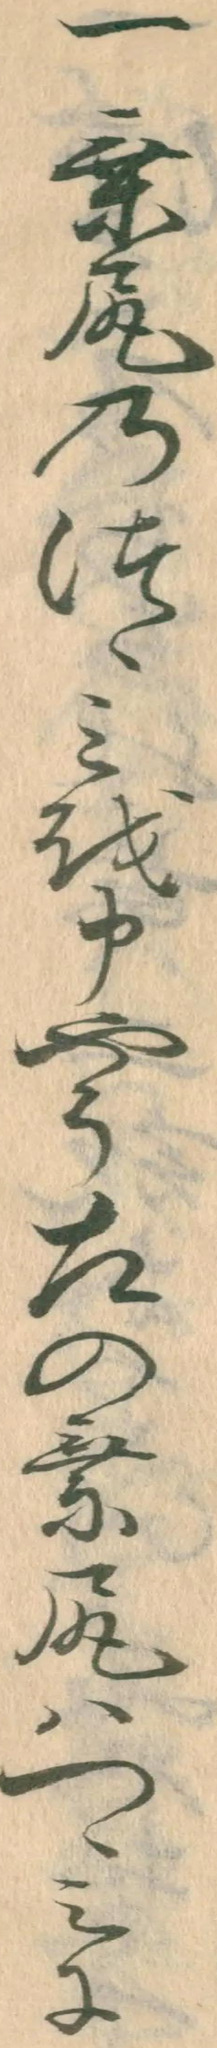一乗尻のつゝみを申やう左の乗尻はつゝみに
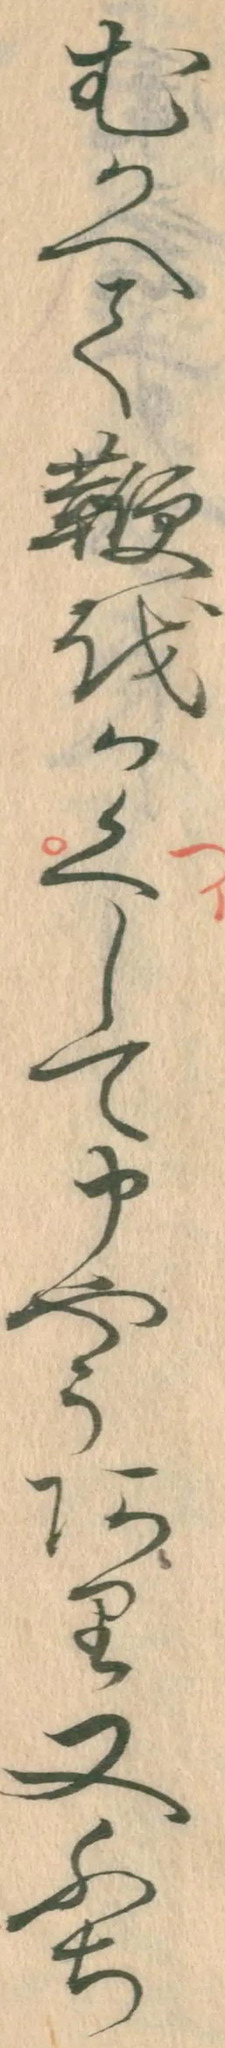むかへて鞭をかくして申やうあり又ふち
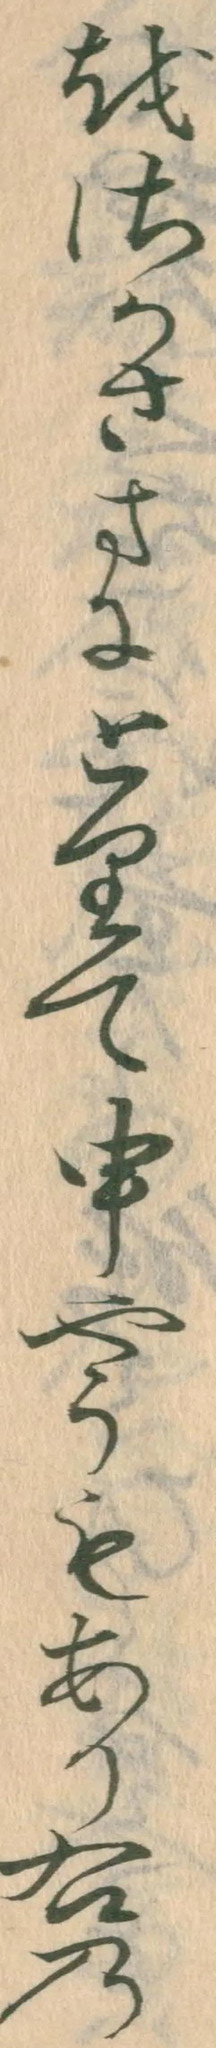をさかさまにとりて申やうもあり右の
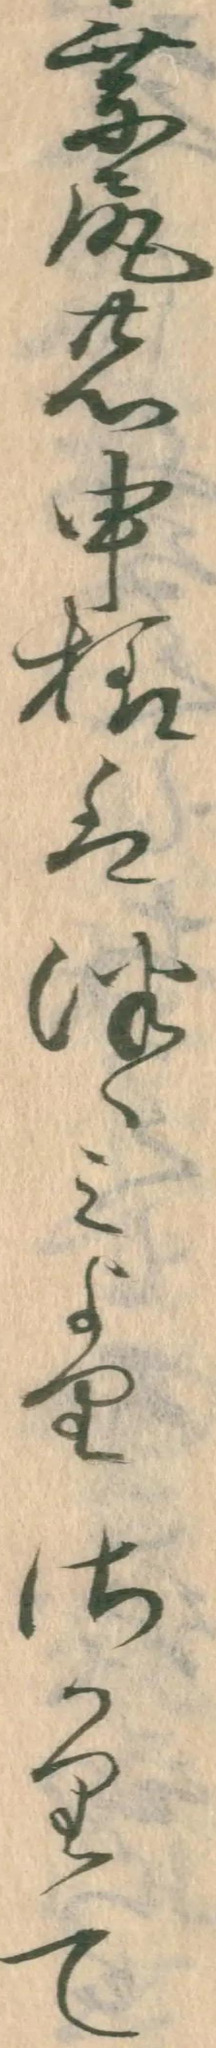乗尻の申様はつゝみよりさかりて
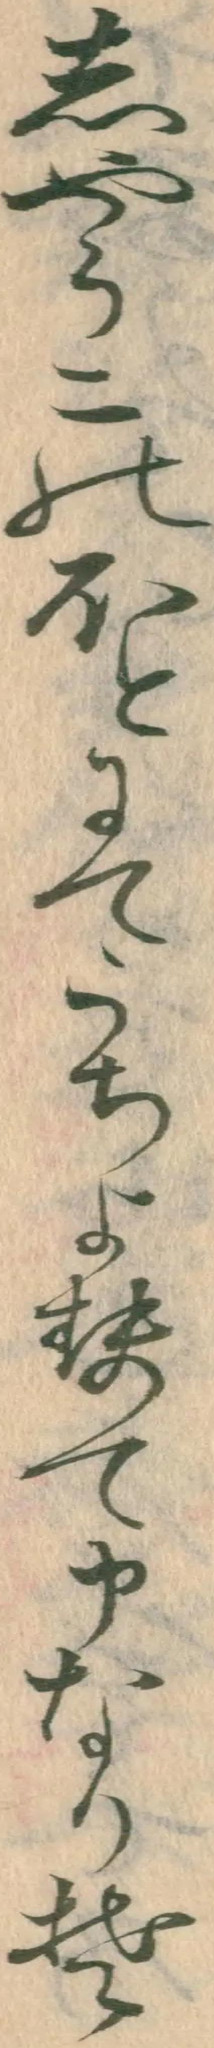しやうこのほとにてうちよせて申なりそ
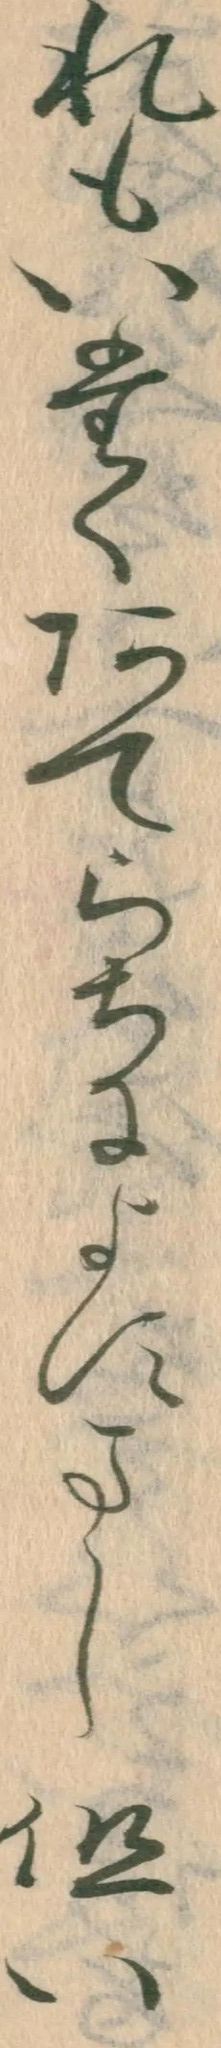れもいたくあてらちによすまし但い
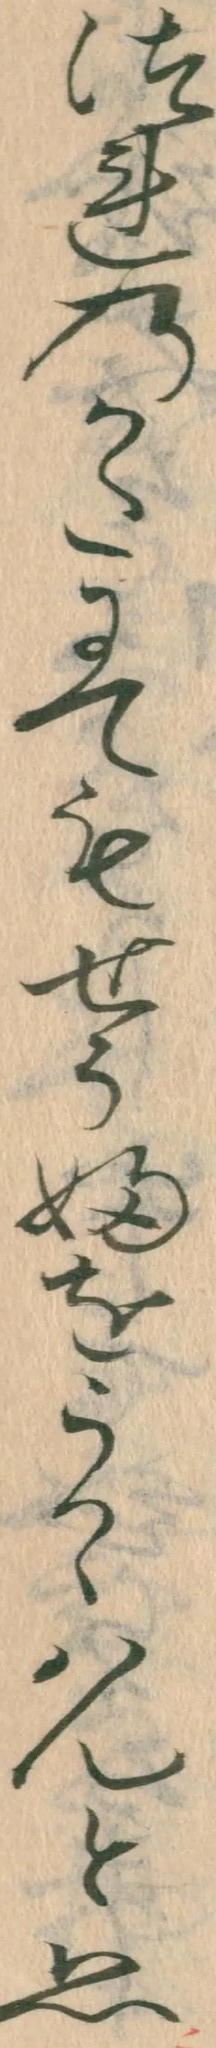つれのかたにてもせうふをうかゝはんと思
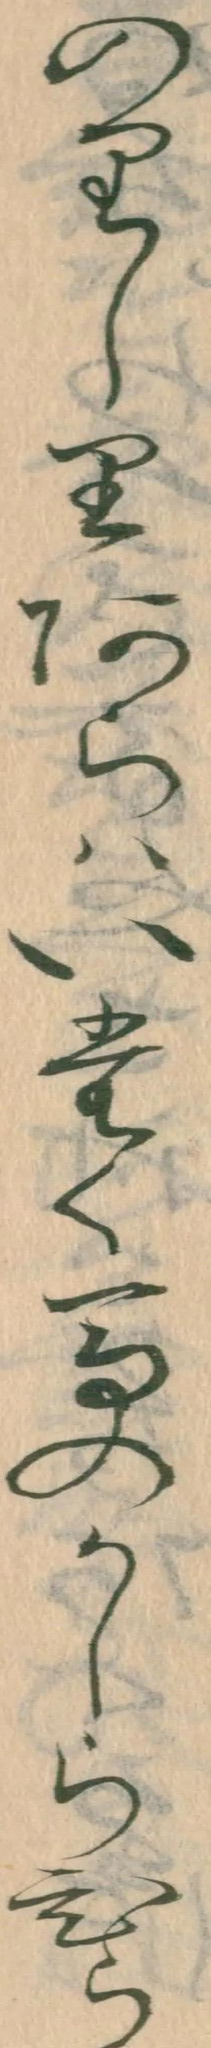のりしりあらはいたく馬のかしらひら
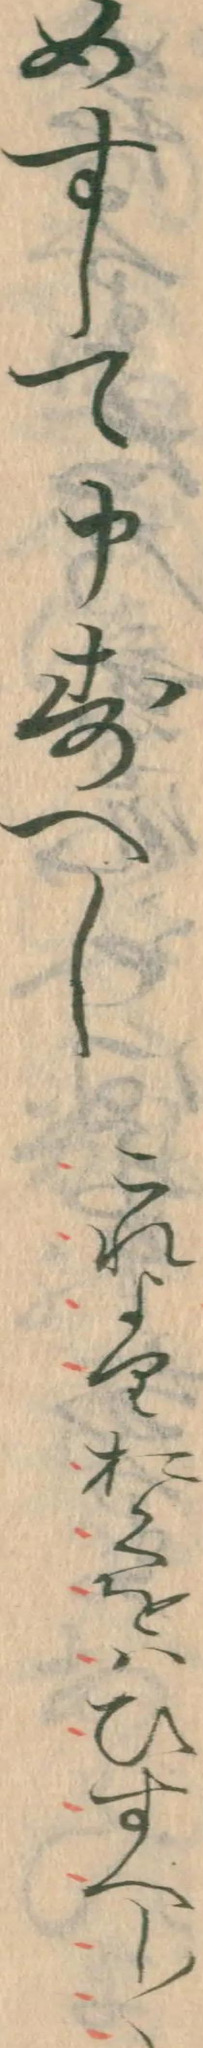めすして申すへし「これよりおくをはひすべし〳〵
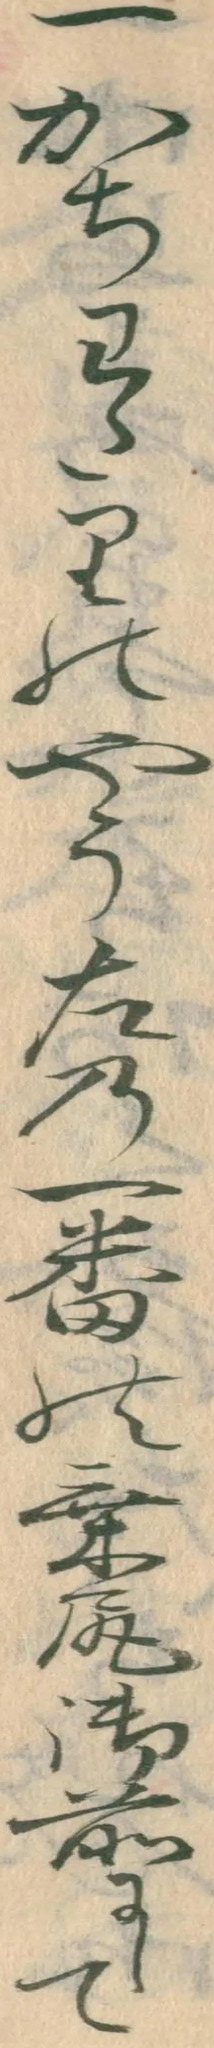一かちわたりのやう左の一番の乗尻御前にして
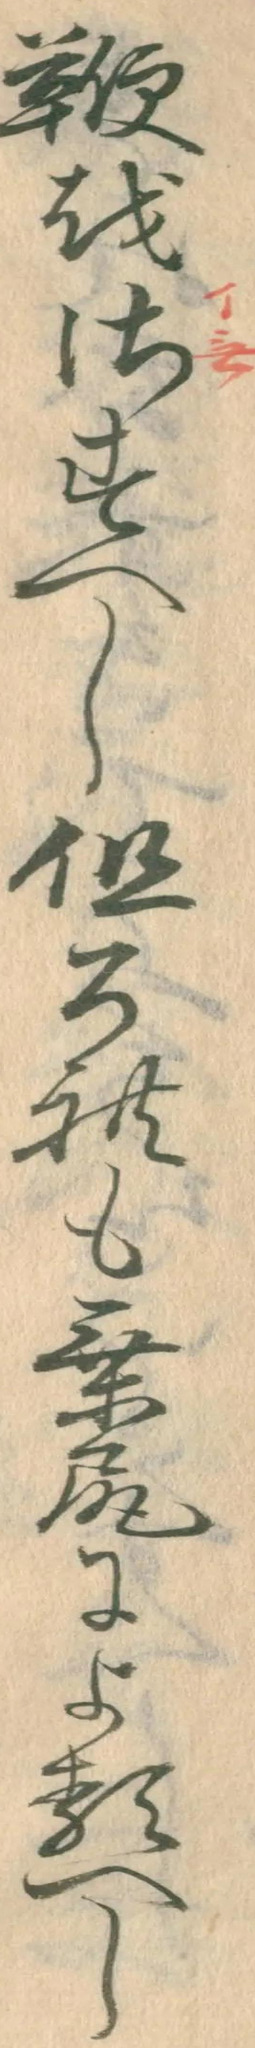鞭をさすへし但それも乗尻によるへし
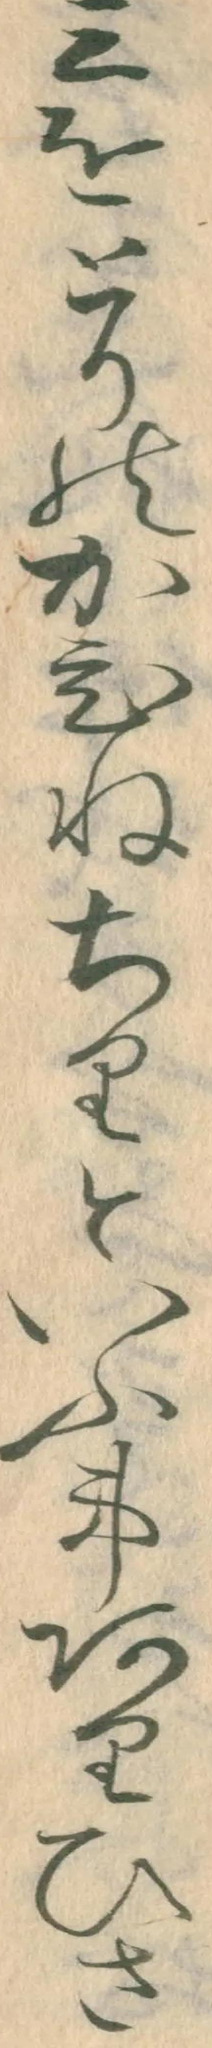三をとりのかひねちりといふ事ありひさ
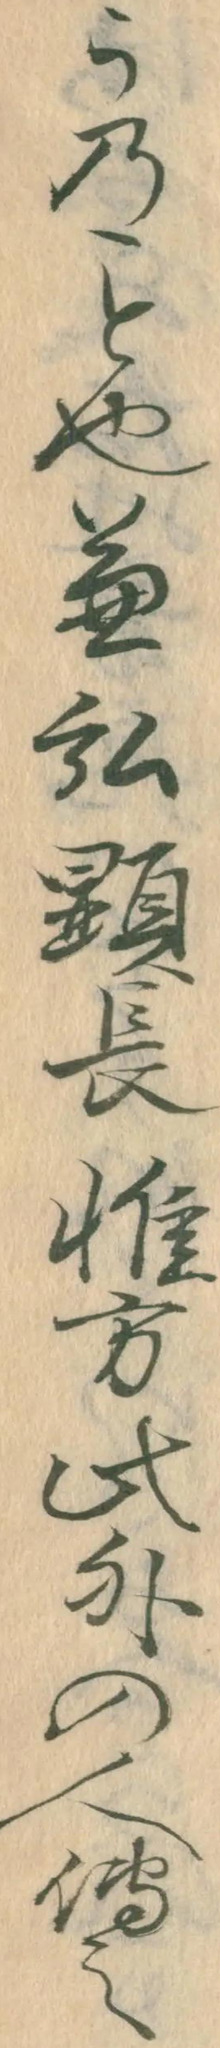うのこと也兼弘顕長惟方此外の人伝え

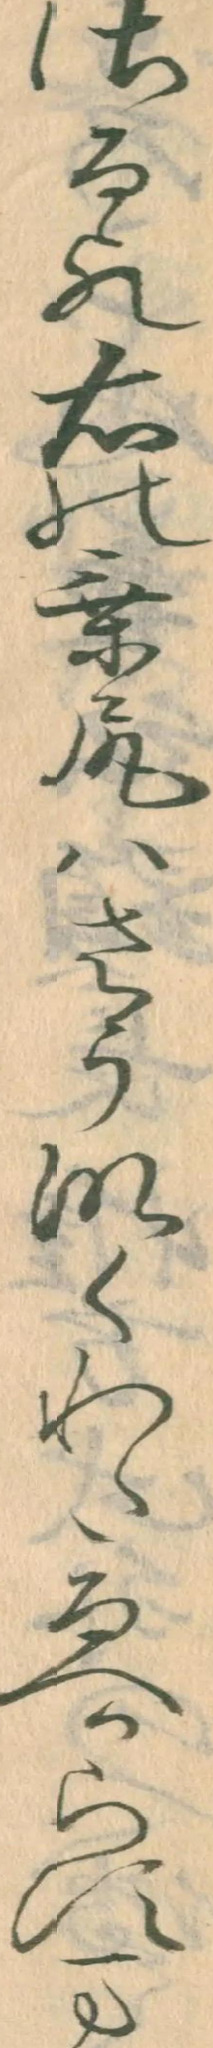さる歟右の乗尻はさうなくわたるへからすま
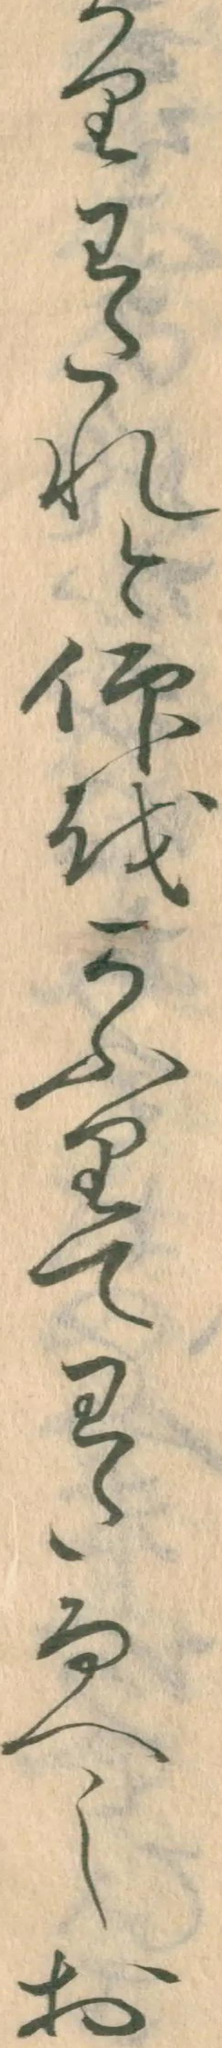かりわたれと仰をかふりてわたるへしお
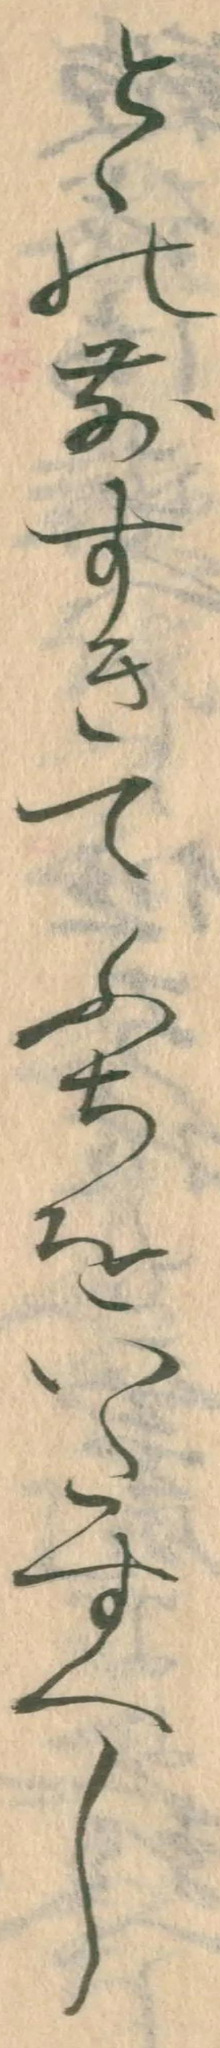とゝの前すきてふちをいたすへし
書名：賀茂社記録. 第13冊
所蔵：国立国会図書館 National Diet Library, JAPAN
